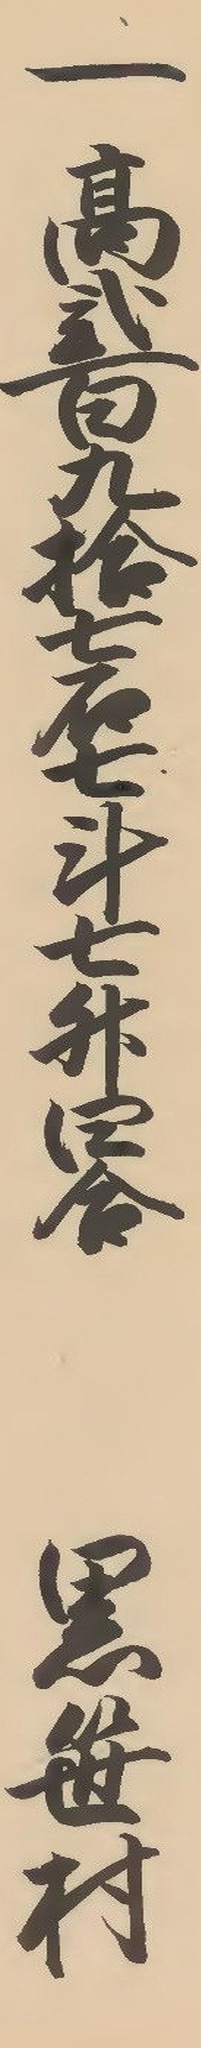一高弐百九拾七石七斗七升四合黒笹村
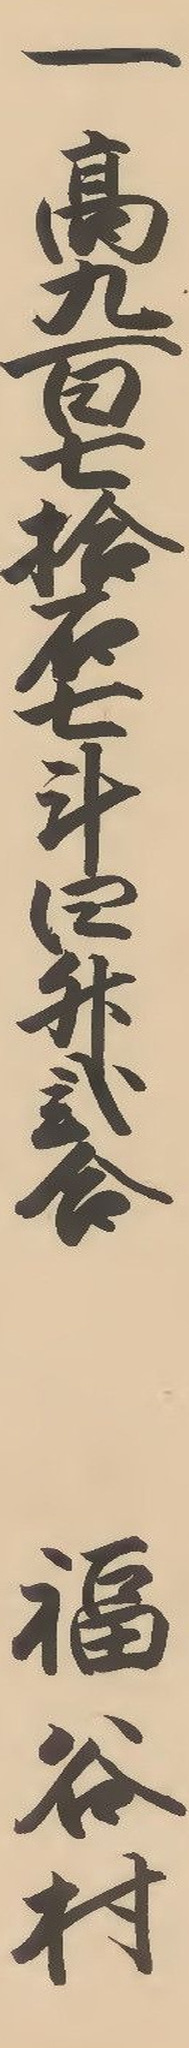一高九百七拾石七斗四升弐合福谷村
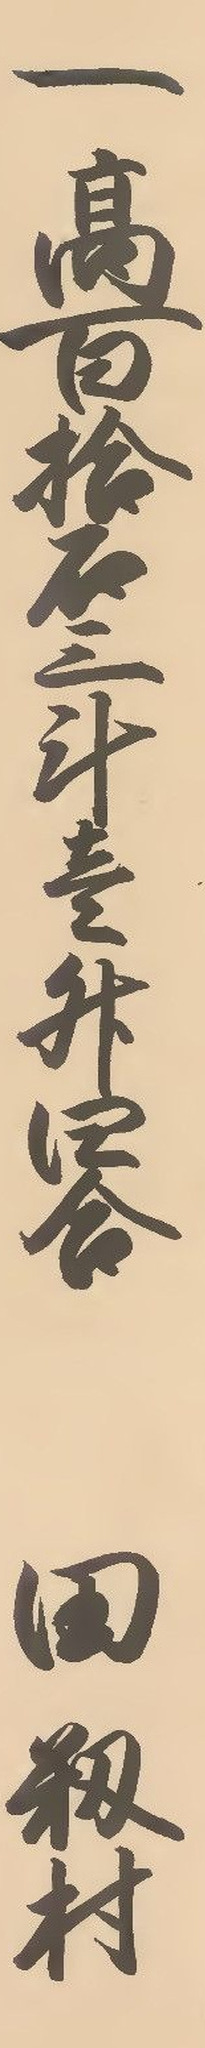一高百拾石三斗壱升四合田籾村
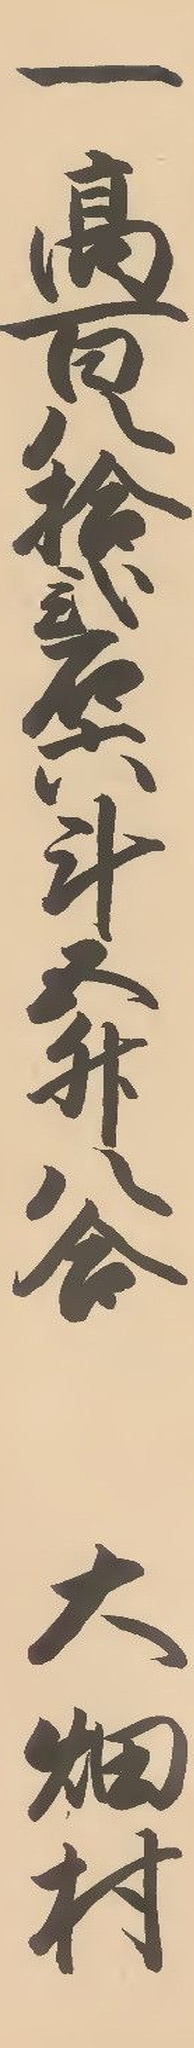一高百八拾弐石六斗五升八合大畑村
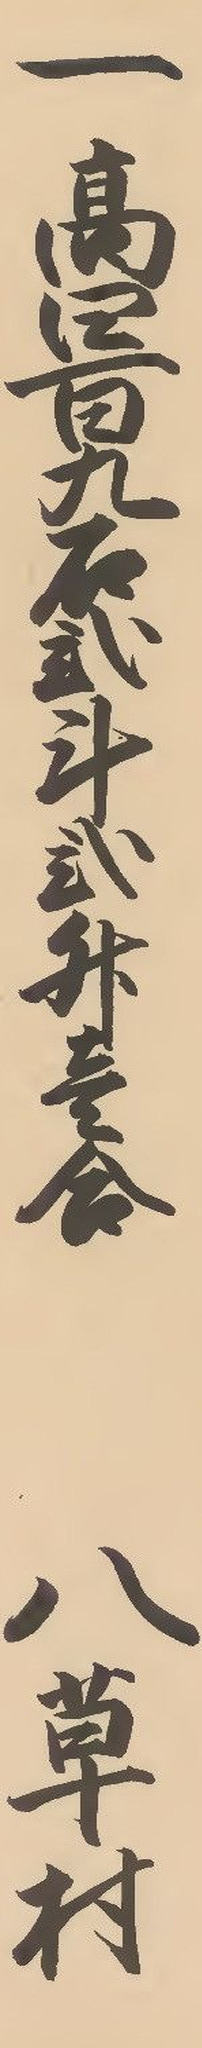一高四百九石弐斗弐升壱合八草村
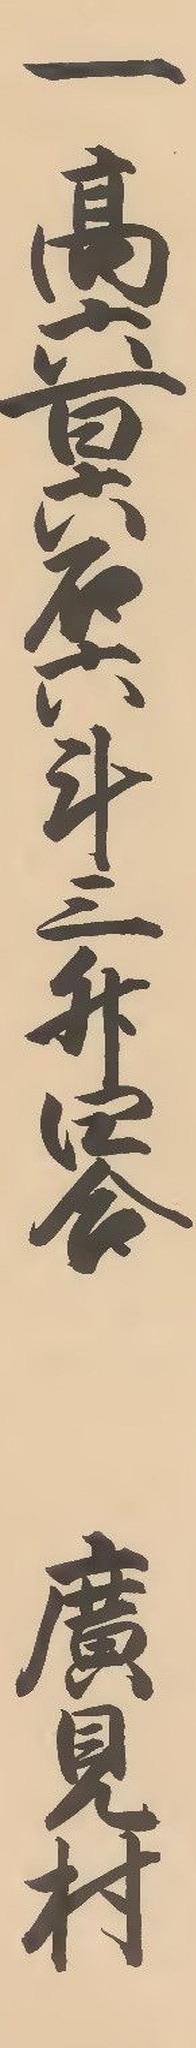一高六百六石六斗三升四合広見村

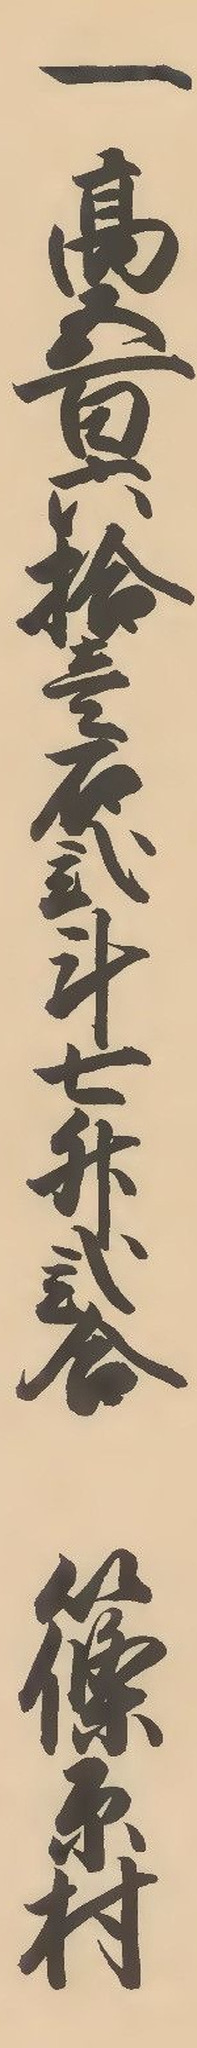一高五百六拾壱石弐斗七升弐合篠原村
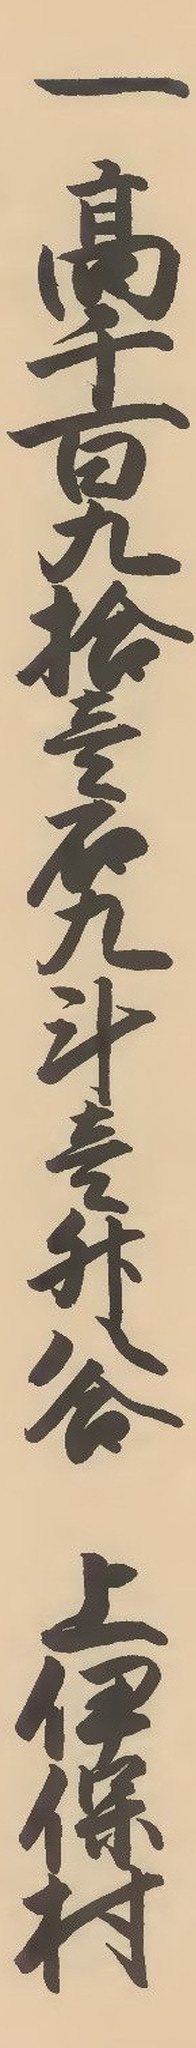一高千百九拾壱石九斗壱升八合上伊保村
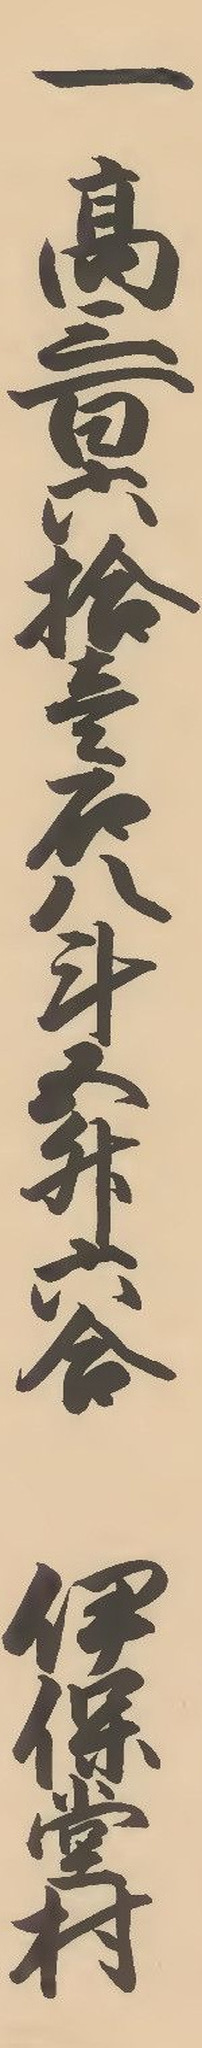一高三百六拾壱石八斗五升六合伊保堂村
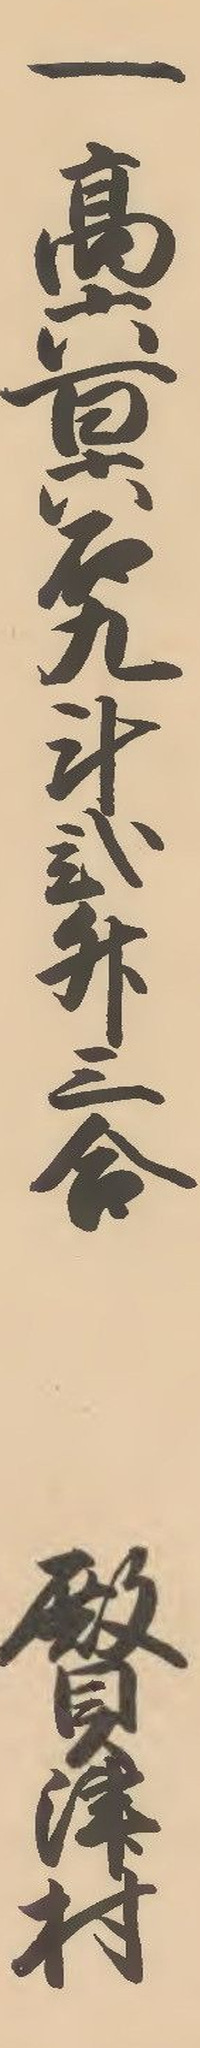一高六百六石九斗弐升三合殿貝津村
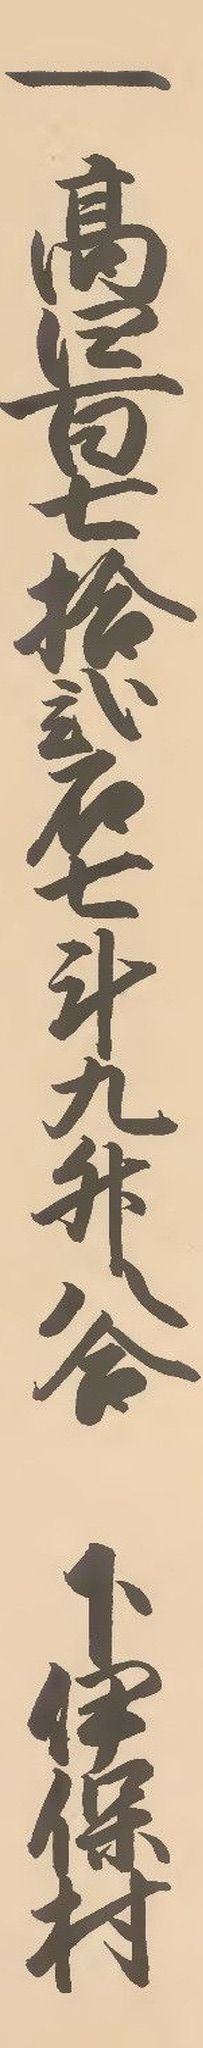一高四百七拾弐石七斗九升八合下伊保村
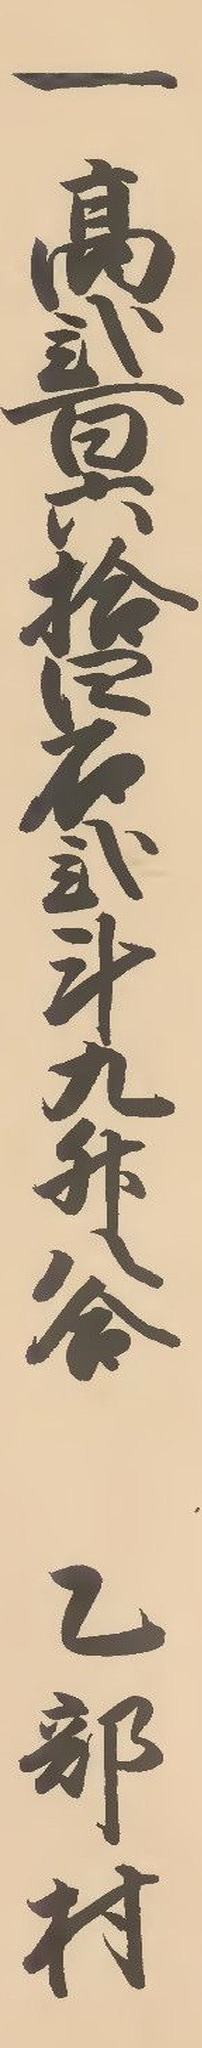一高弐百六拾四石弐斗九升八合乙部村
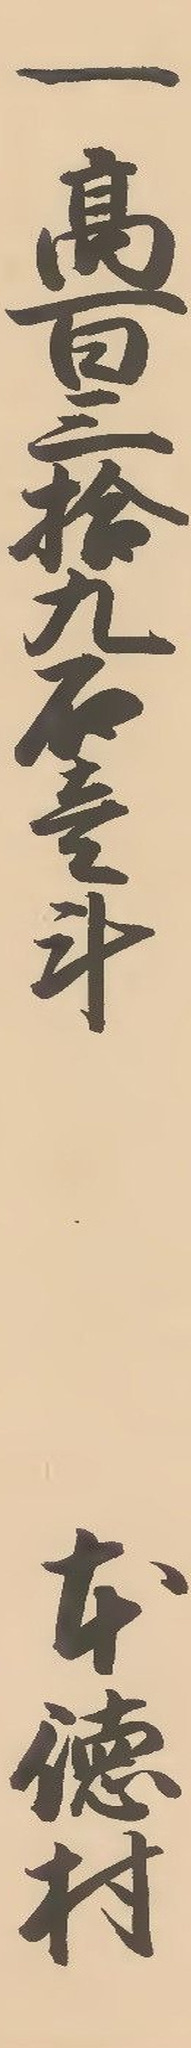一高百三拾九石壱斗本徳村

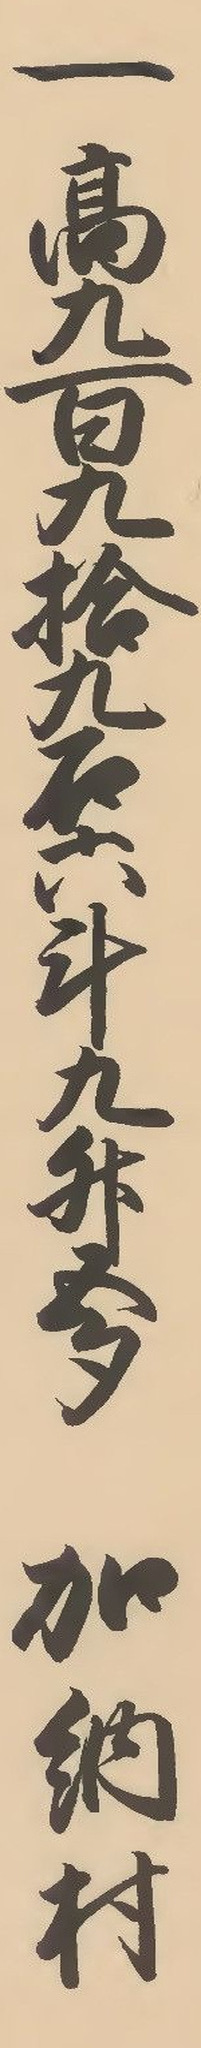一高九百九拾九石六斗九升五勺加納村
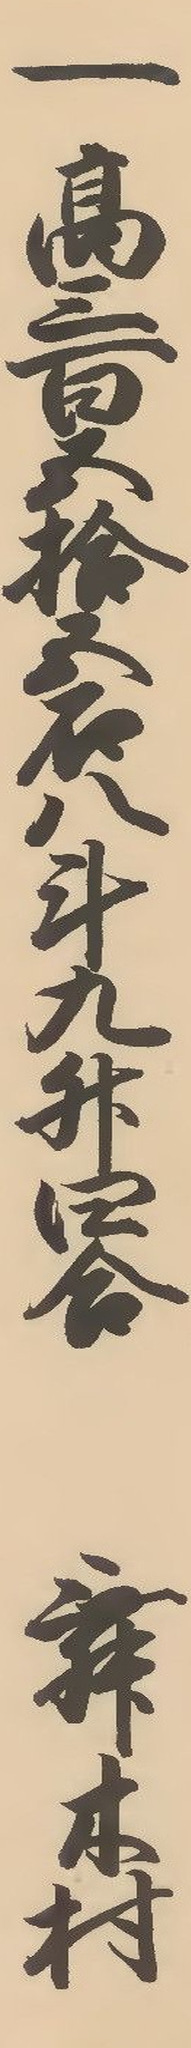一高三百五拾五石八斗九升四合舞木村
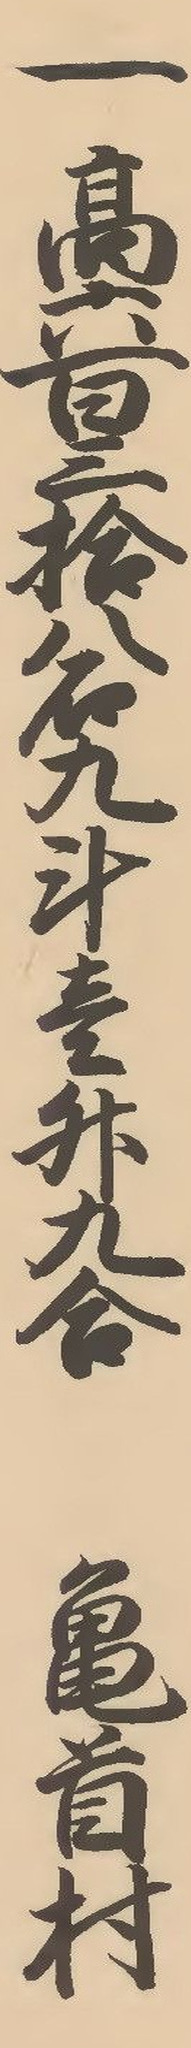一高六百三拾八石九斗壱升九合亀首村
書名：三河国郷帳
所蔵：国立公文書館 National Archives of Japan
